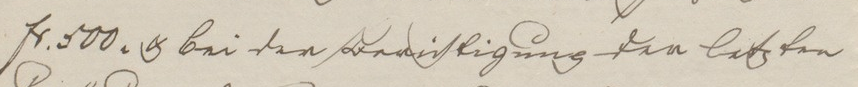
Fr. 500– & bei der Berichtigung der letzten
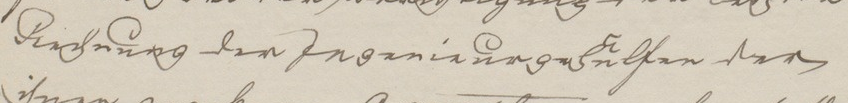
Rechnung der Ingenieurgehülfen der
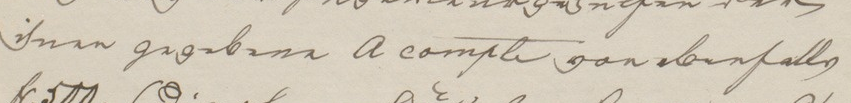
ihnen gegebene A compli von ebenfalls
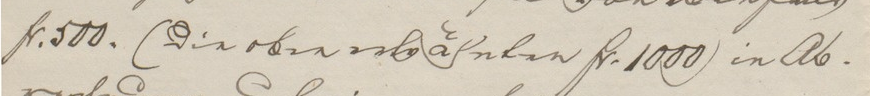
Fr. 500– (die eben erwähnten Fr. 1000) in Ab-
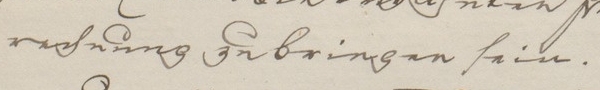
rechnung zu bringen sein.
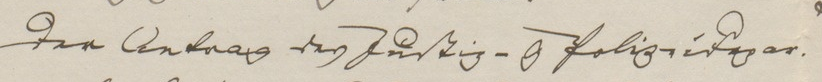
Der Antrag des Justiz– & Polizeidepar-
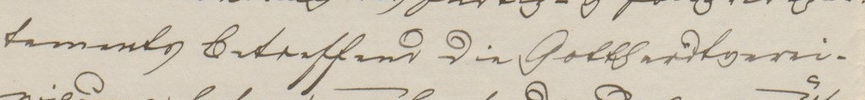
tements betreffend die Gotthardtverei-
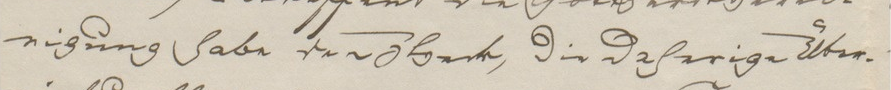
nigung habe den Zweck, die daherige Über-
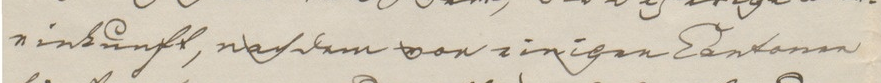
einkunft, nachdem von einigen Kantonen
